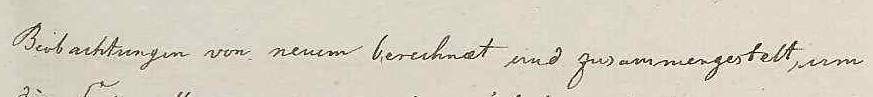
Beobachtungen von neuem berechnet und zusammengestelt, um
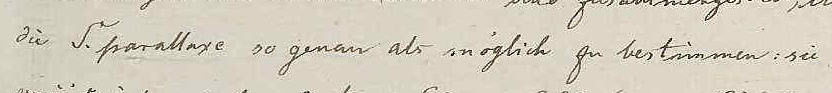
die S.parallaxe so genau als möglich zu bestimmen: sie
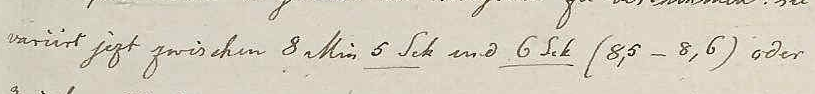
variirt jezt zwischen 8 Min. 5 Sek. und 6 Sek. oder
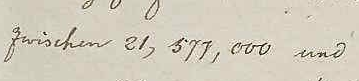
zwischen 21,577,000 und
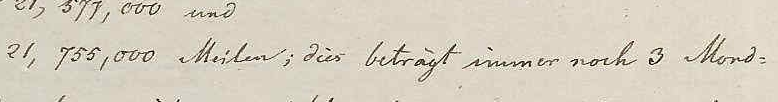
21,755,000 Meilen; dies beträgt immer noch 3 Mond-
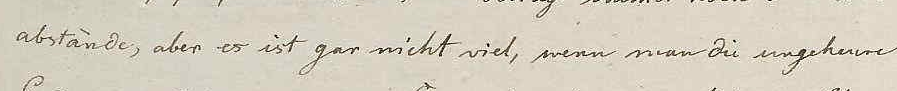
abstände, aber es ist gar nicht viel, wenn man die ungeheure
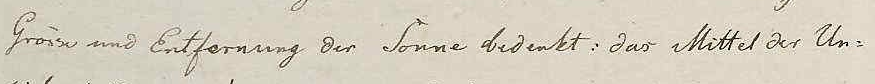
Grösse und Entfernung der Sonne bedenkt: das Mittel der Un-
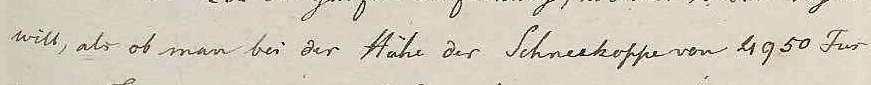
will, als ob man bei der Höhe der Schneekoppe von 4950 Fus
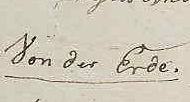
Von der Erde.
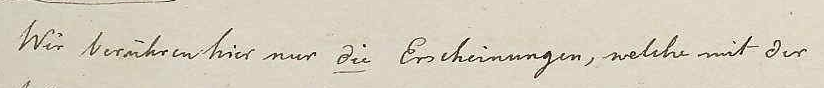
Wir berühren hier nur die Erscheinungen, welche mit der
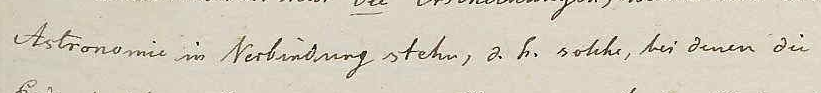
Astronomie in Verbindung stehn, d. h. solche, bei denen die
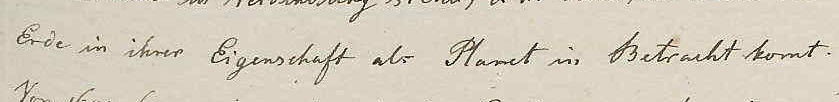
Erde in ihrer Eigenschaft als Planet in Betracht komt.
